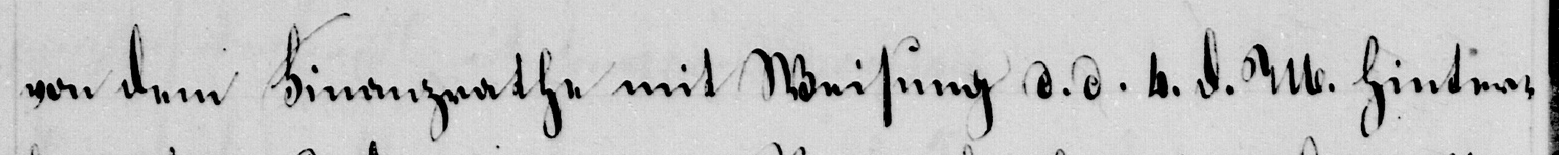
von dem Finanzrathe mit Weisung d. d. 4. d. M. hinter¬
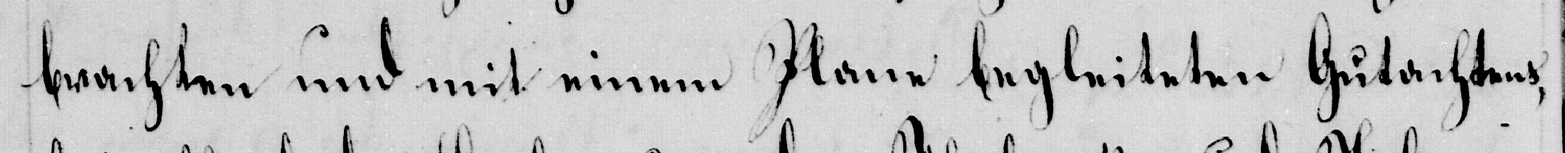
brachten und mit einem Plane begleiteten Gutachtens,
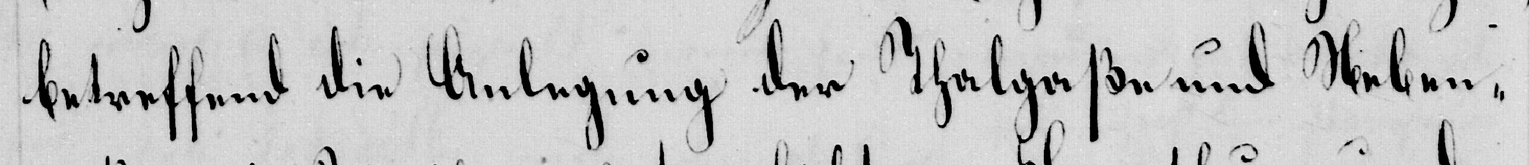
betreffend die Anlegung der Thalgaße und Neben¬
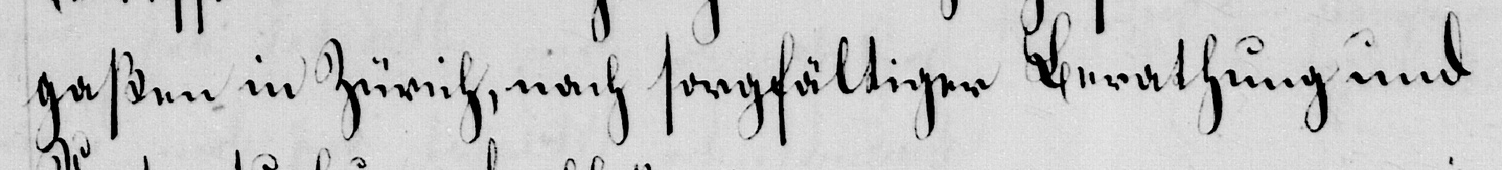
gaßen in Zürich, nach sorgfältiger Berathung und
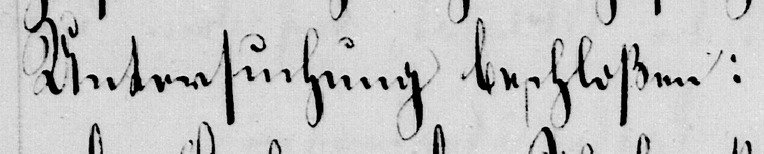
Untersuchung beschloßen:
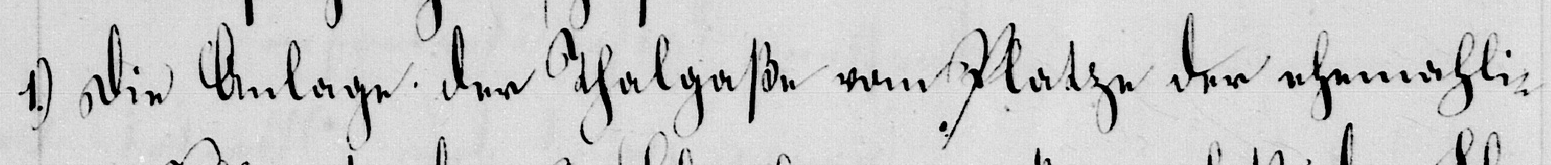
1.) Die Anlage der Thalgaße vom Platze der ehemali¬
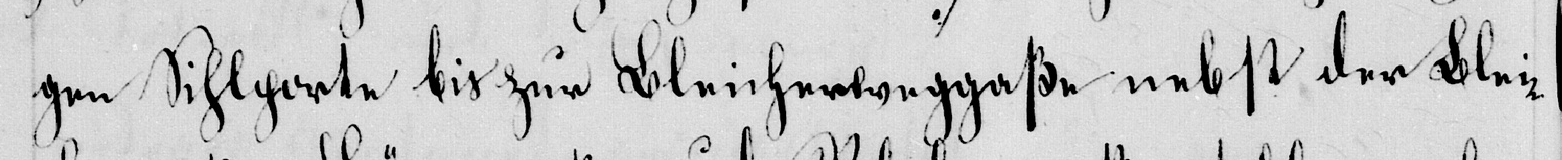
gen Sihlporte bis zur Bleicherweggaße nebst der Blei¬
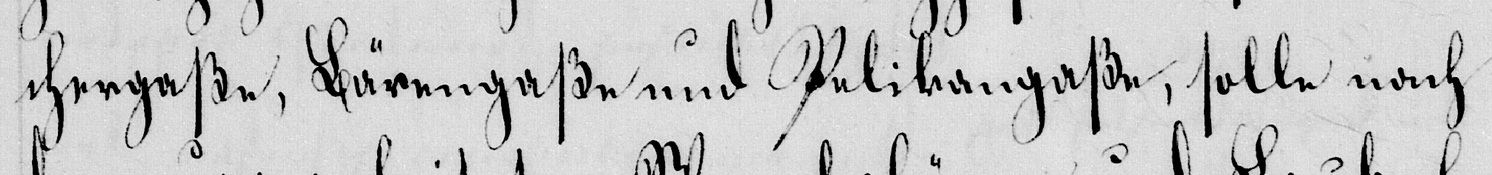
chergaße, Bärengaße und Pelikangaße, solle nach
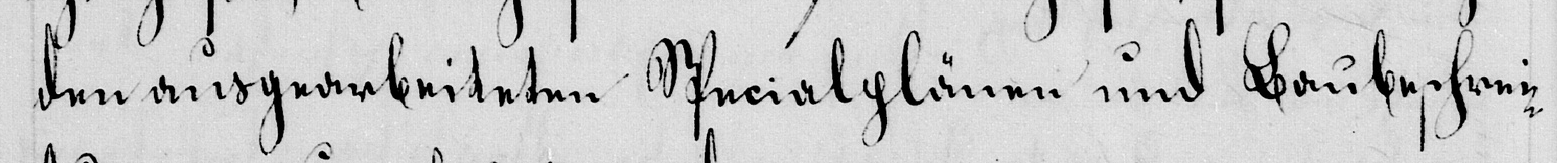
den ausgearbeiteten Specialplänen und Baubeschrei¬
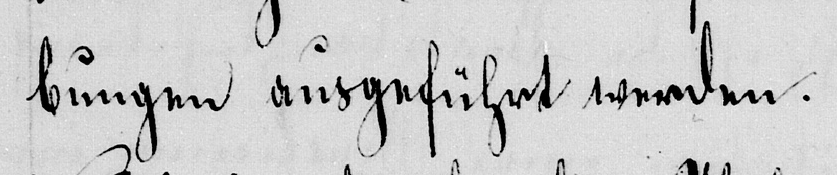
bungen ausgeführt werden.
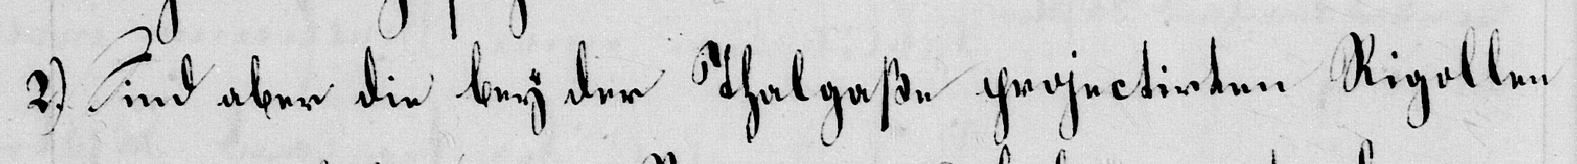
2.) Sind aber die bey der Thalgaße projectirten Rigollen
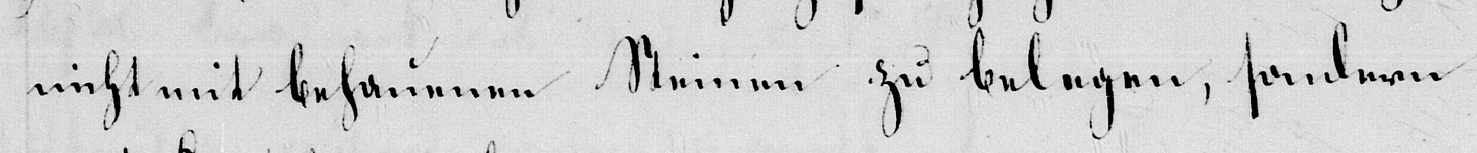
nicht mit behauenen Steinen zu belegen, sondern
